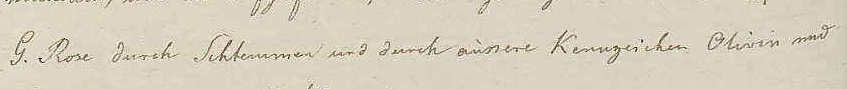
G. Rose durch Schlemmen und durch äussere Kennzeichen Olivin und
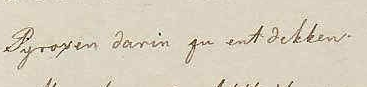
Pyroxen darin zu entdekken.
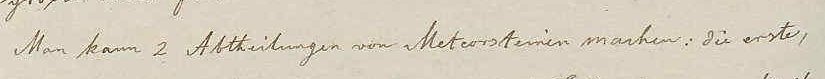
Man kann 2 Abtheilungen von Meteorsteinen machen: die erste,
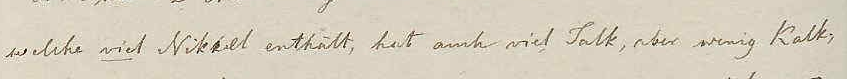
welche viel Nikkel enthält, hat auch viel Talk, aber wenig Kalk;
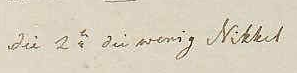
die 2￼ die wenig Nikkel
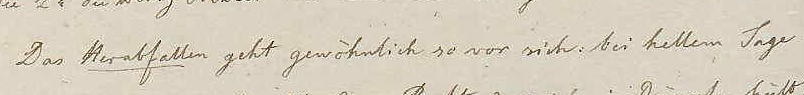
Das Herabfallen geht gewöhnlich so vor sich: bei hellem Tage
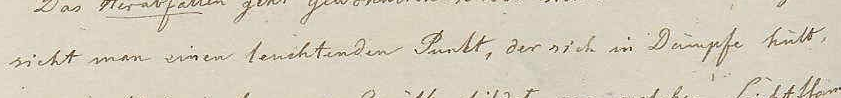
sieht man einen leuchtenden Punkt, der sich in Dämpfe hült,
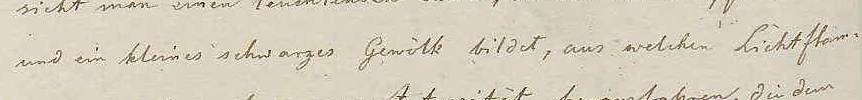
und ein kleines schwarzes Gewölk bildet, aus welchen Lichtflam-
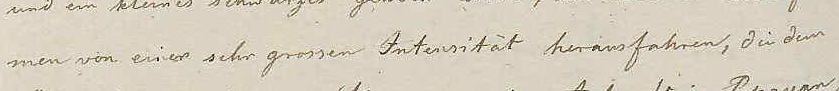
men von einer sehr grossen Intensität herausfahren, die dem
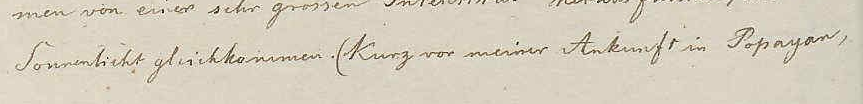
Sonnenlicht gleichkommen. (Kurz vor meiner Ankunft in Popayan,
